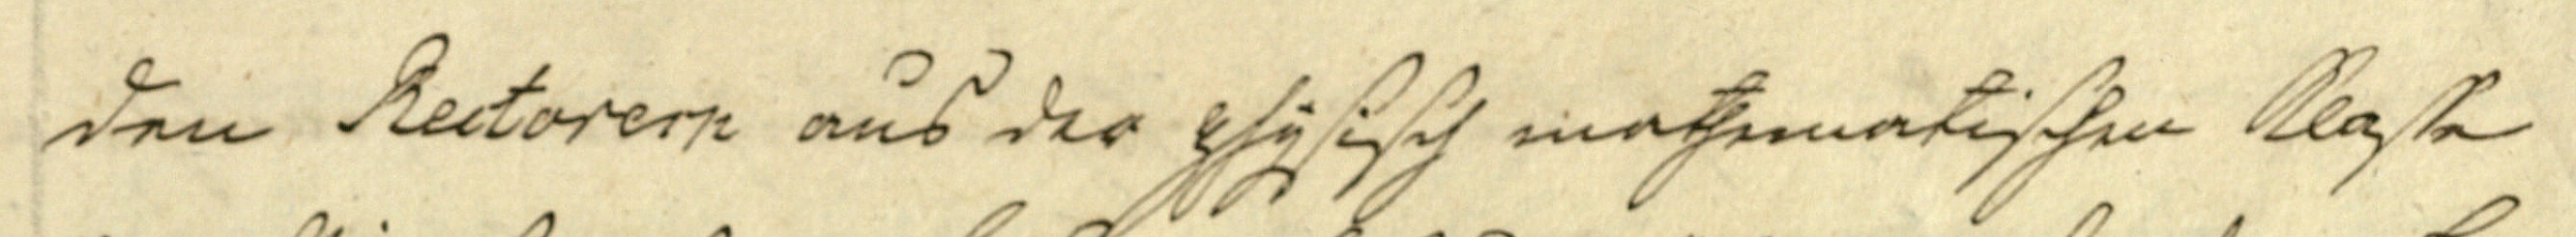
den Rectorem aus der phÿsisch mathematischen Klasse
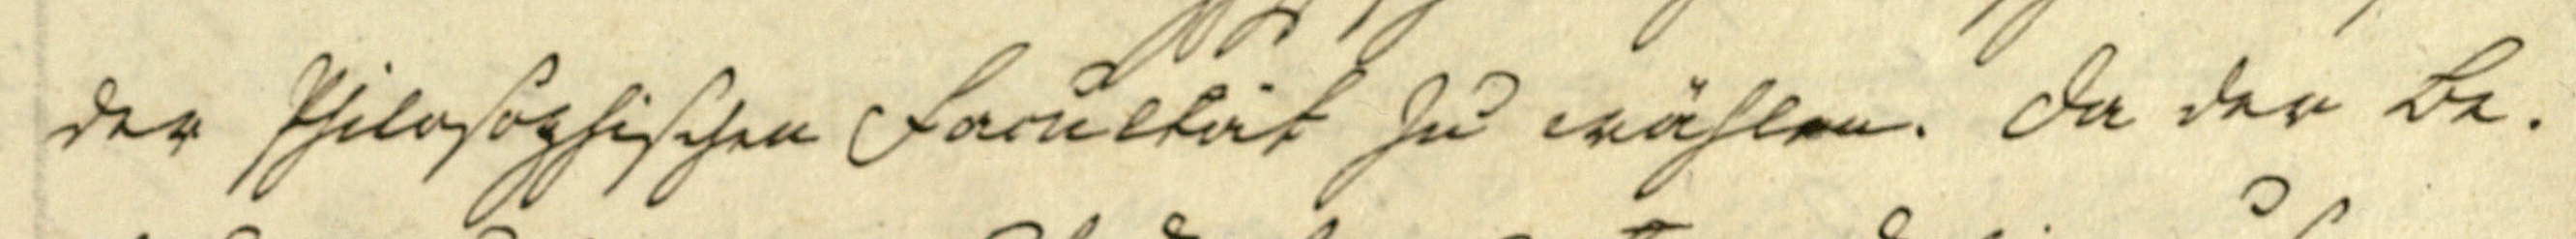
der Philosophischen Facultät zu wählen. Da der Be¬
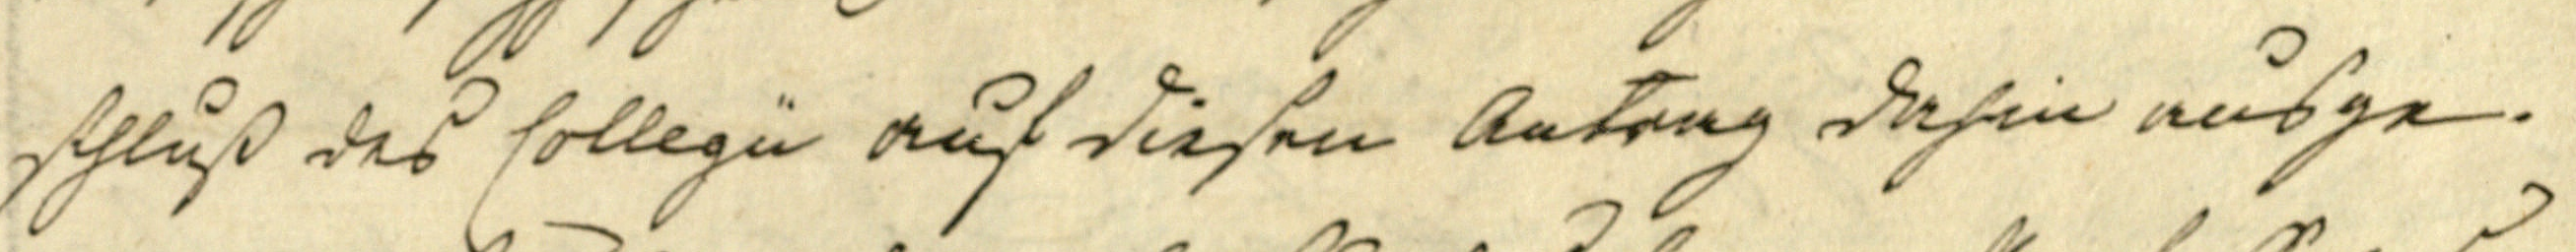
schluß des Collegii auf diesen Antrag dahin ausge¬
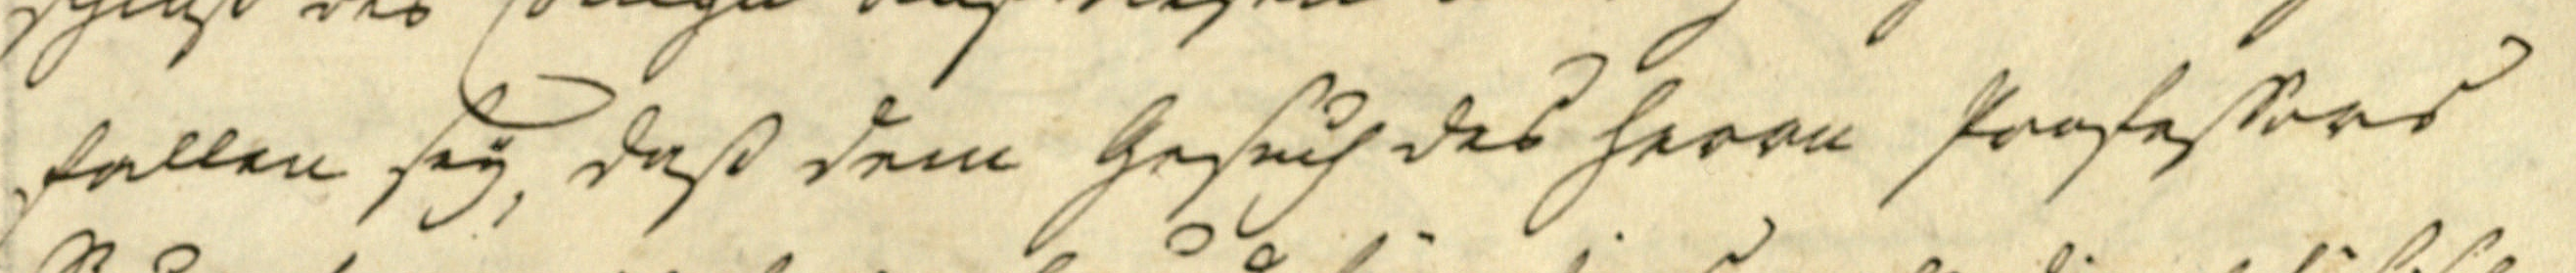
fallen seÿ, daß dem Gesuch des Herrn Professors
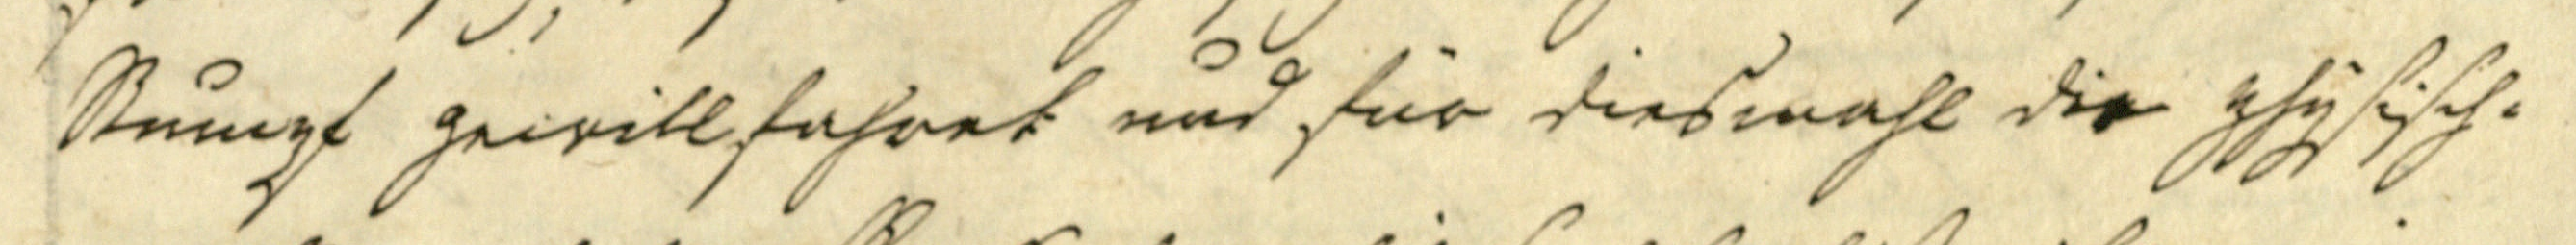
Stumpf gewillfahret und für dies mahl die phÿsisch
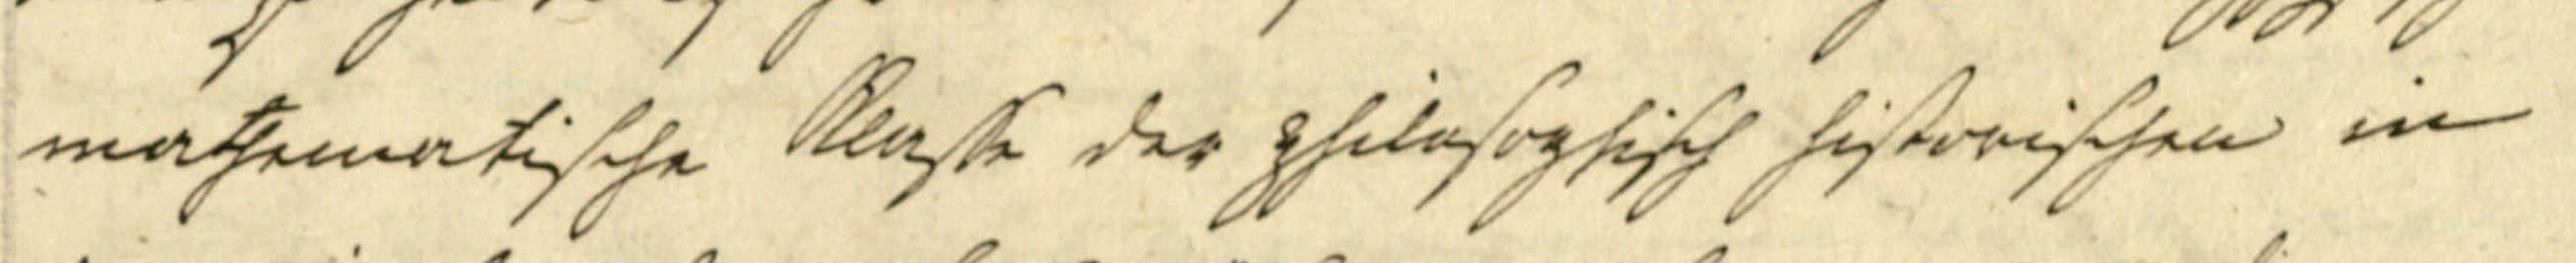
mathematische Klasse der philosophisch historischen in
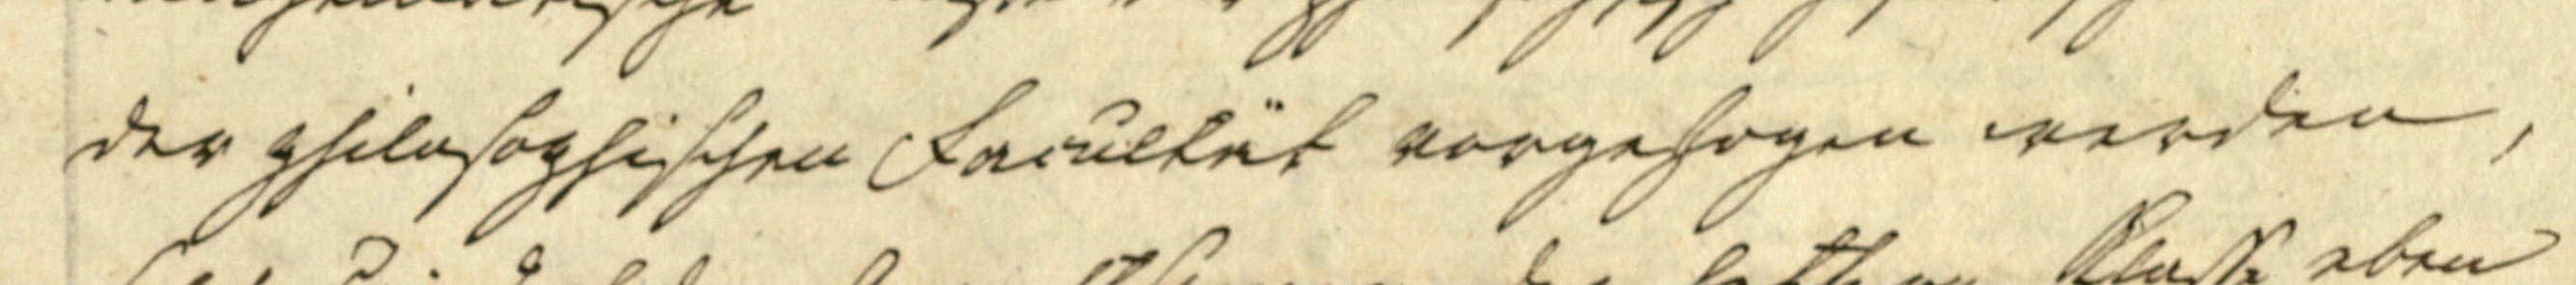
der philosophischen Facultät vorgezogen werden,
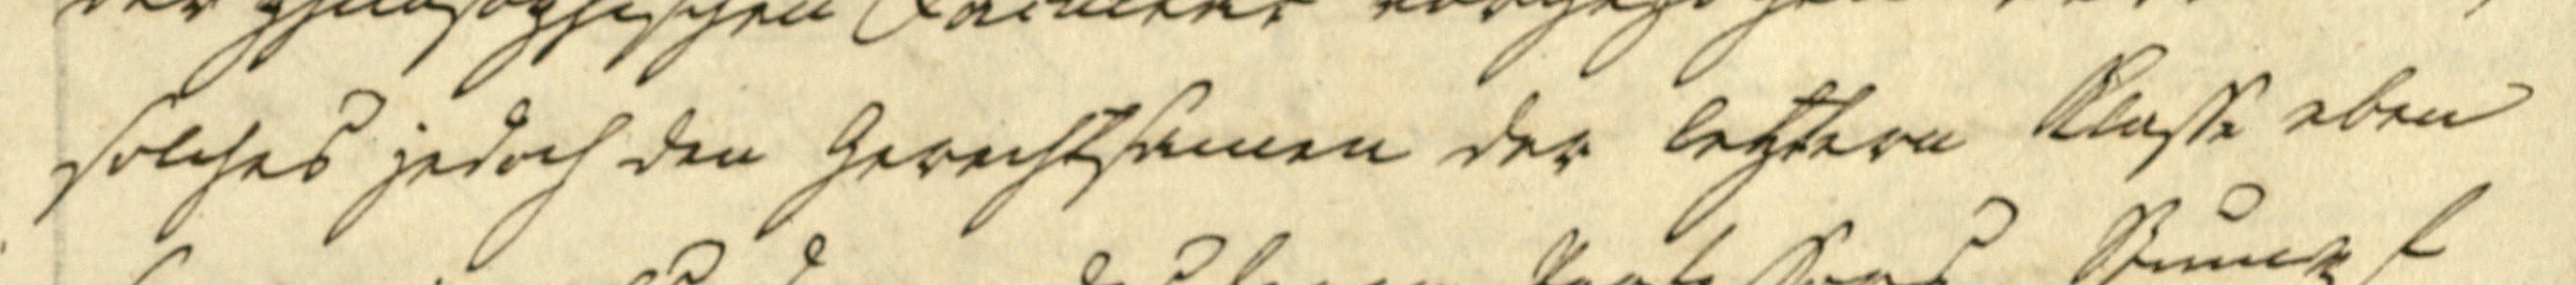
solches jedoch den Gerechtsamen der letztern Klasse eben
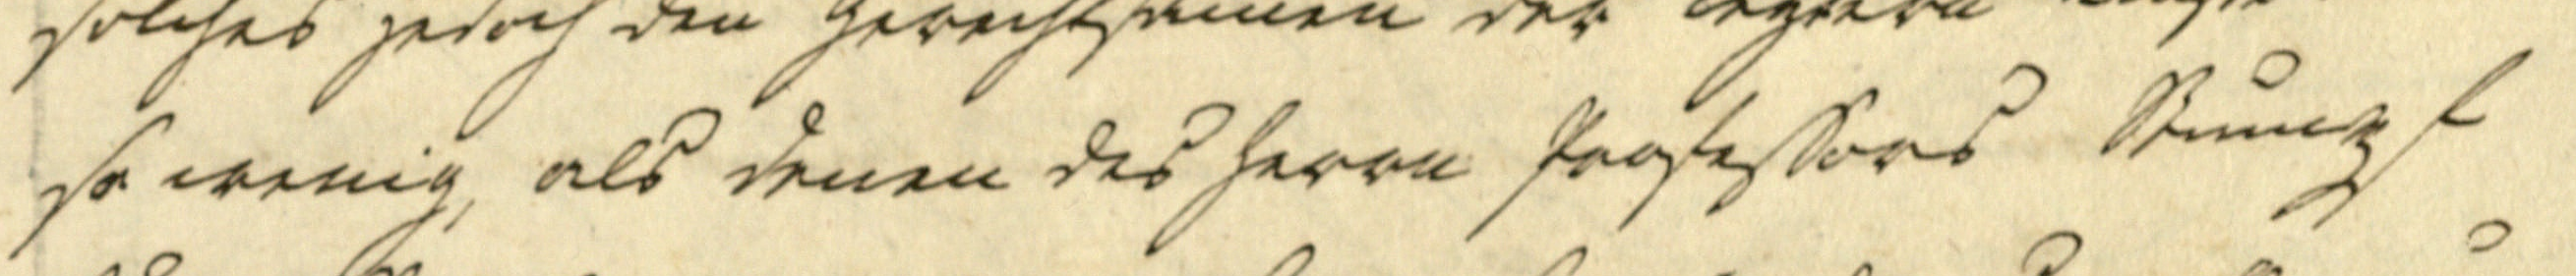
so wenig, als denen des Herrn Professors Stumpf
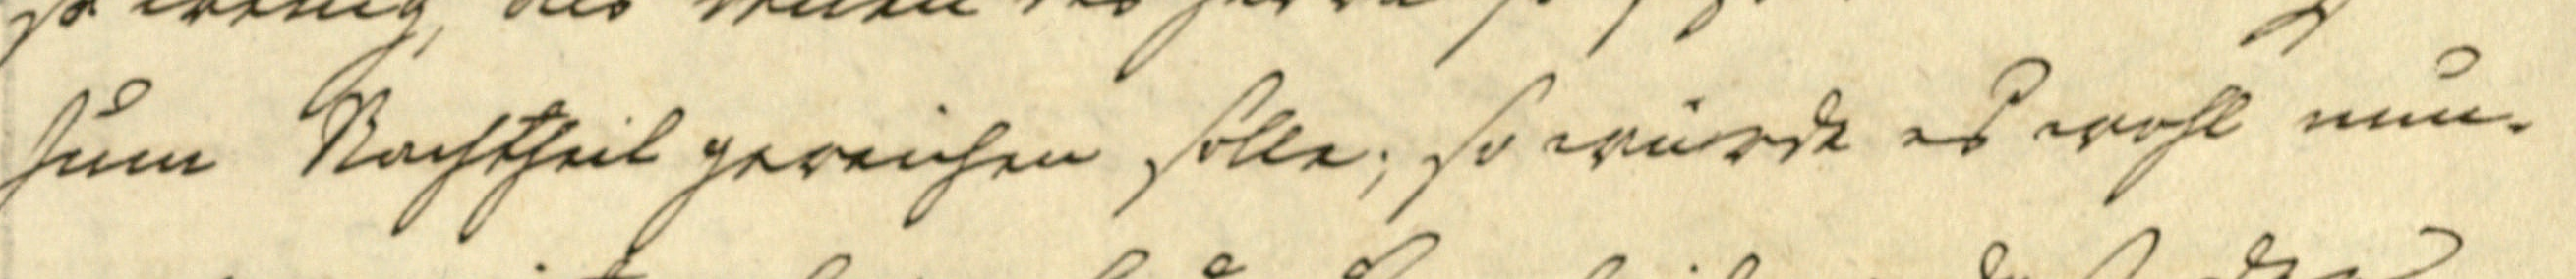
zum Nachtheil gereichen solle; so würde es wohl nun¬
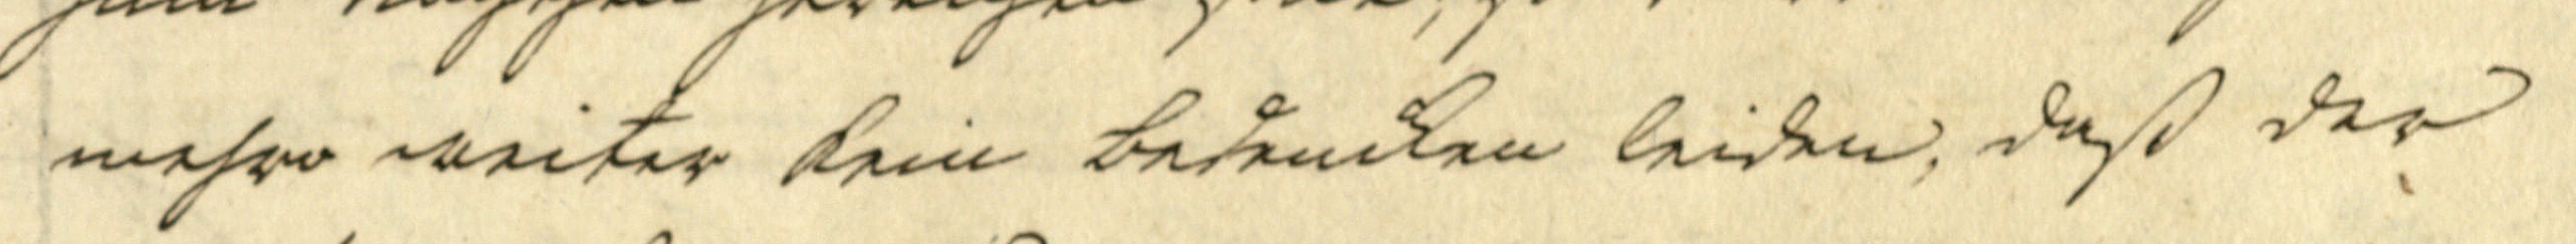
mehro weiter kein Bedencken leiden, daß der
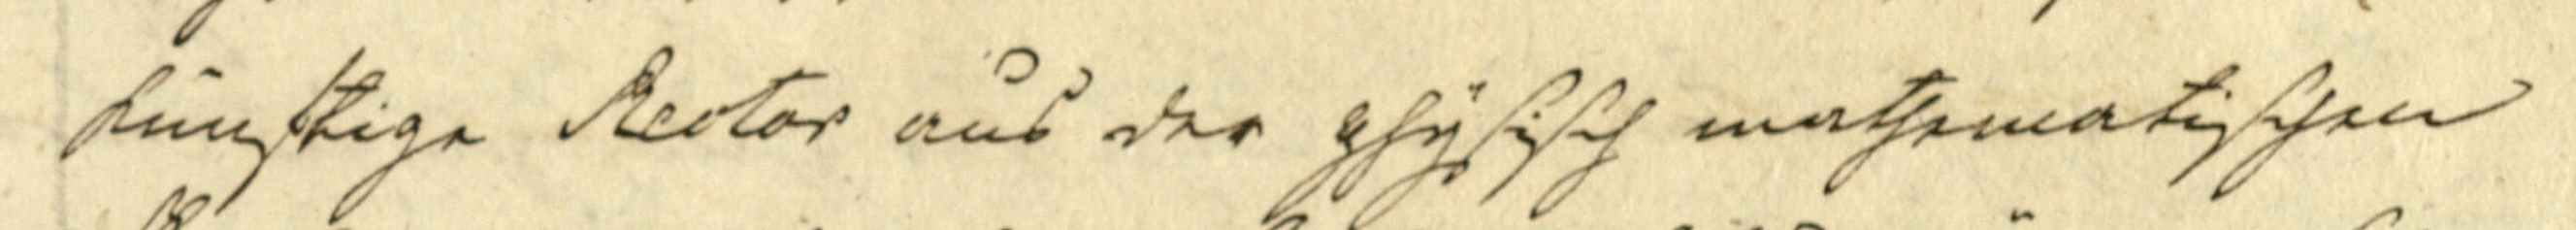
künftige Rector aus der phÿsisch mathematischen
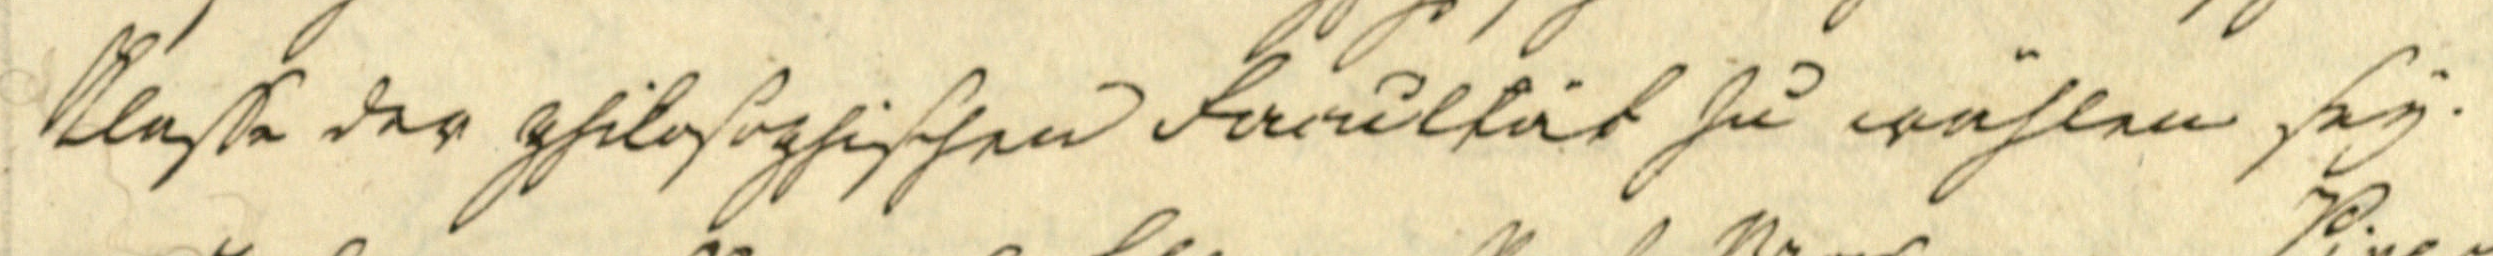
Klasse der philosophischen Facultät zu wählen seÿ.
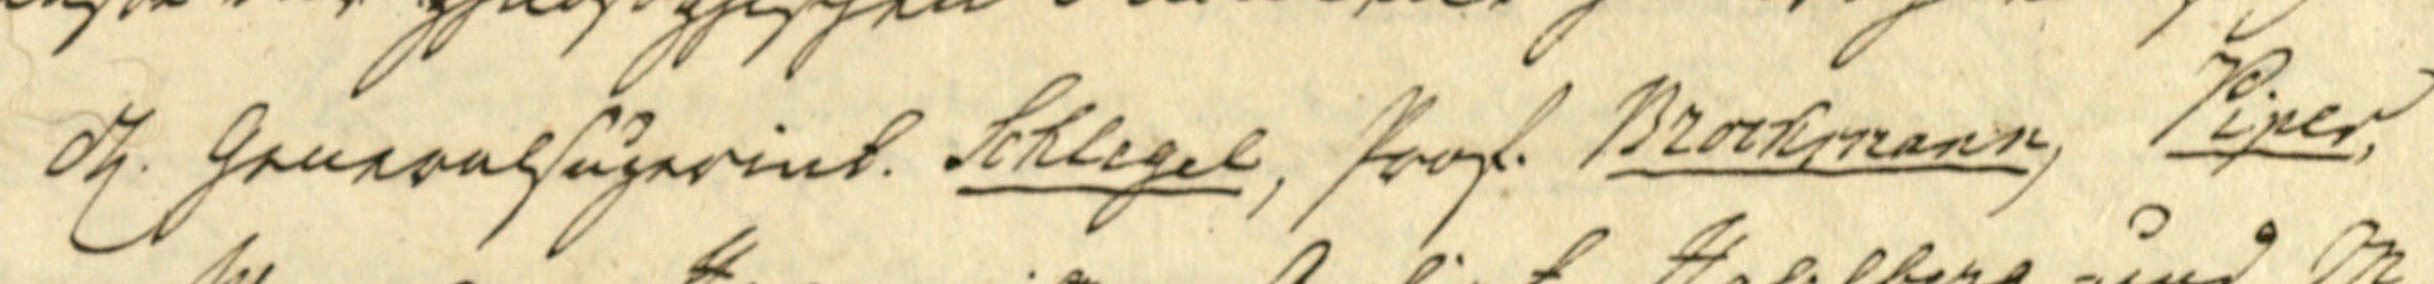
dh. Generalsuperint. Schlegel, Prof. Brockmann, Piper,
